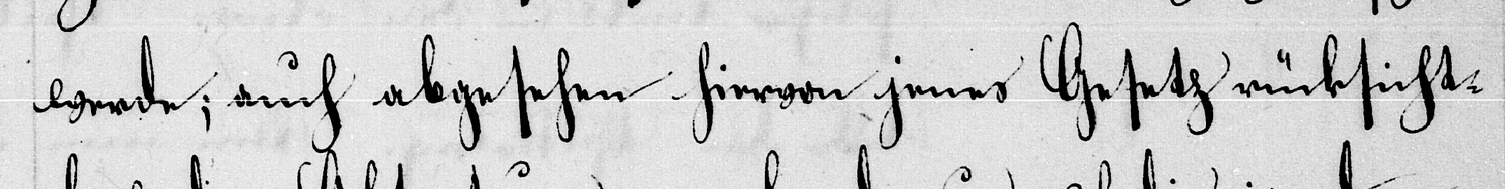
werde; auch abgesehen hiervon jenes Gesetz rücksicht¬
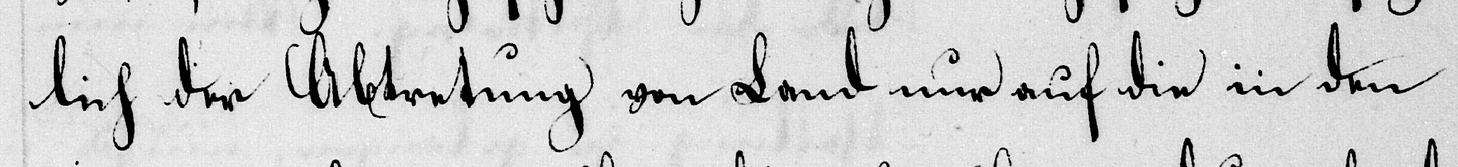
lich der Abtretung von Land nur auf die in den
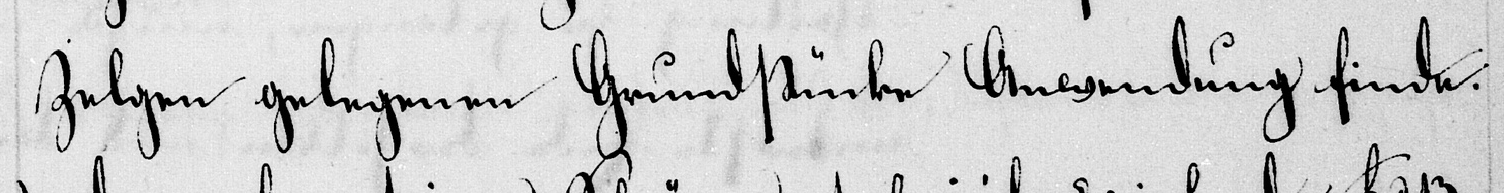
Zelgen gelegenen Grundstücke Anwendung finde.
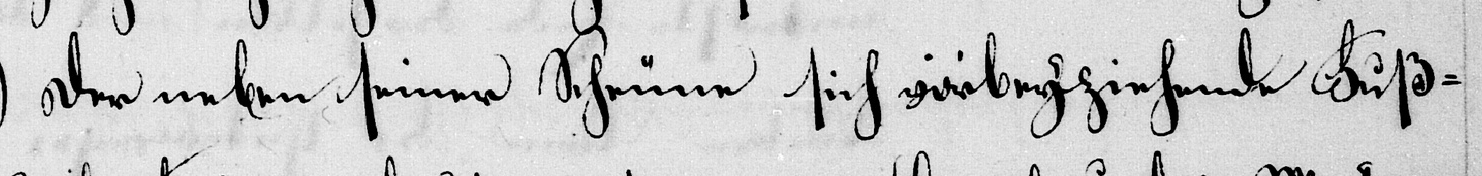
Der neben seiner Scheuer sich vorbeiziehende Fuß-
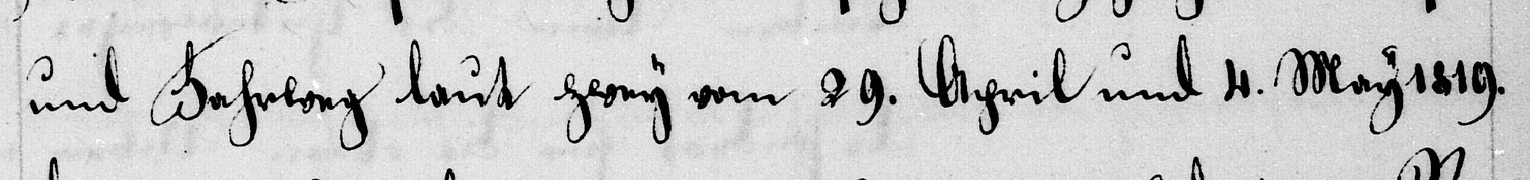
und Fahrweg laut zwey vom 29. April und 4. May 1819.
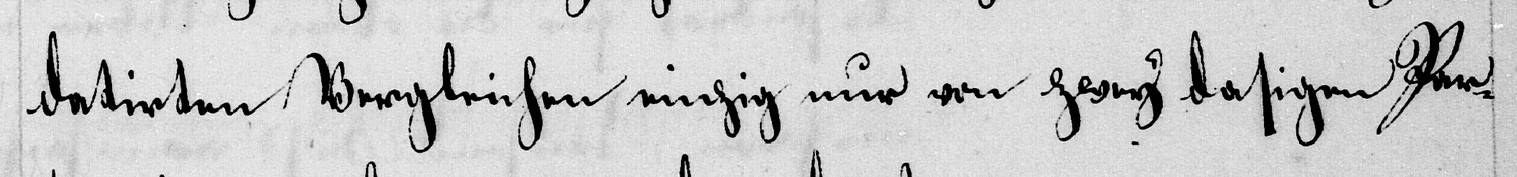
datirten Vergleichen einzig nur von zwey dasigen Par¬
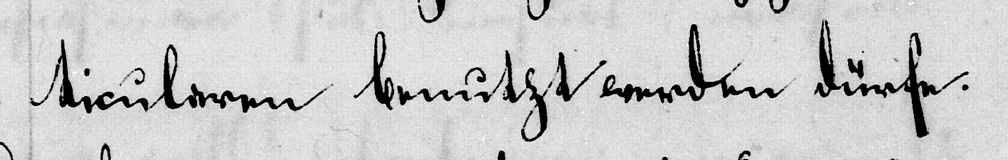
ticularen benutzt werden dürfe.
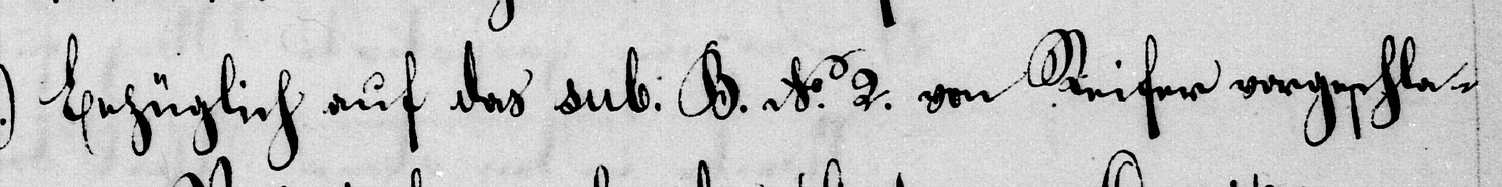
Bezüglich auf das sub. B. No. 2. von Reifer vorgeschla¬
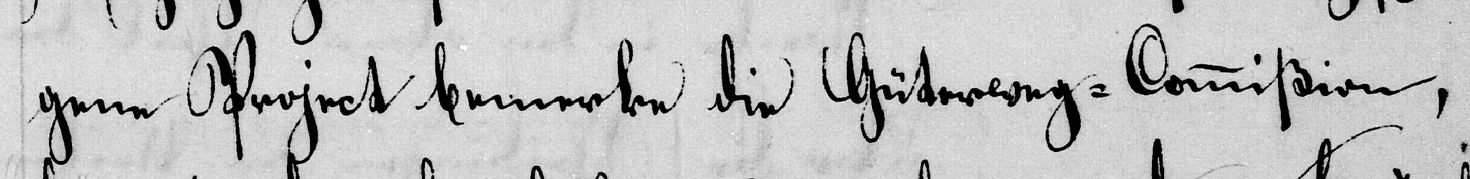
gene Project bemerke die Güterweg-Commißion,
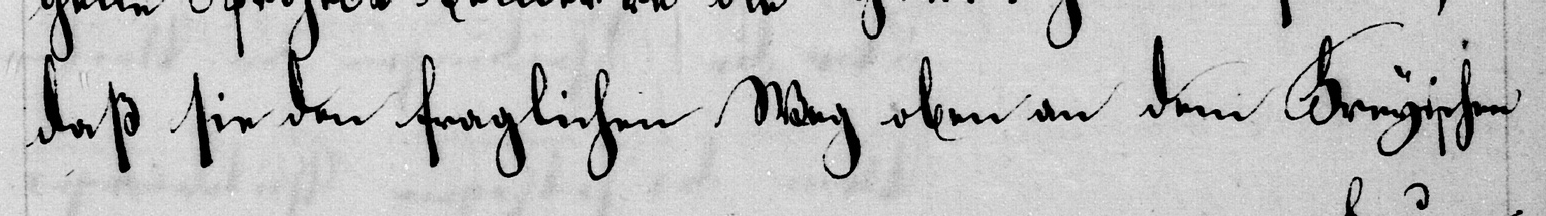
daß sie den fraglichen Weg oben an dem Freyischen
